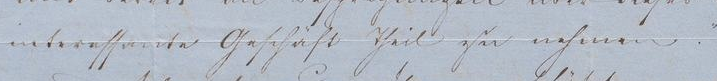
interessante Geschäft Theil zu nehmen.»
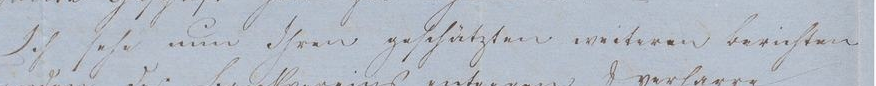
Ich sehe nun Ihren geschätzten weiteren Berichten
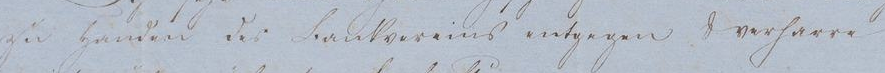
zu Handen des Bankvereins entgegen & verharre
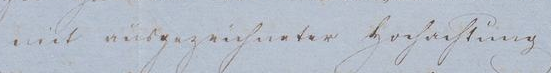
mit ausgezeichneter Hochachtung.
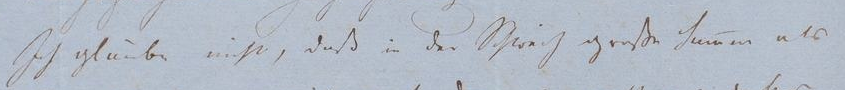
Ich glaube nicht, daß in der Schweiz große Summen als
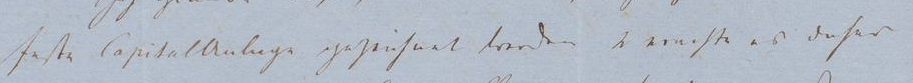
feste CapitalAnlage gezeichnet werden & erachte es daher
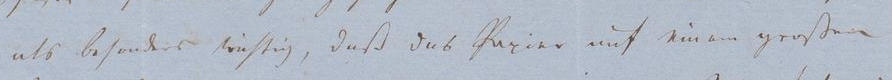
als besonders wichtig, daß das Papier auf einem großen
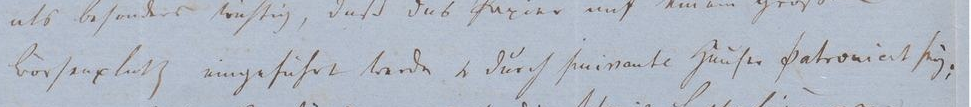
Börsenplatz eingeführt werde & durch puissante Häuser patroniert sey;
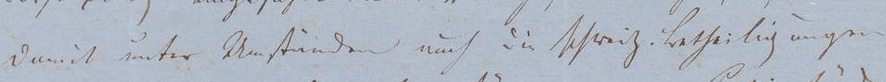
damit unter Umständen auch die schweiz. Betheiligungen
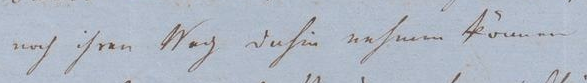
noch ihren Weg dahin nehmen können.
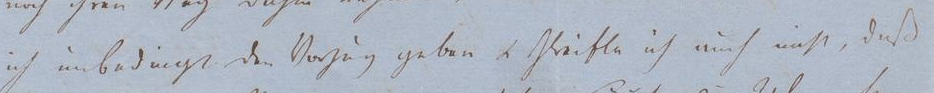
ich unbedingt den Vorzug geben & zweifle ich auch nicht, daß
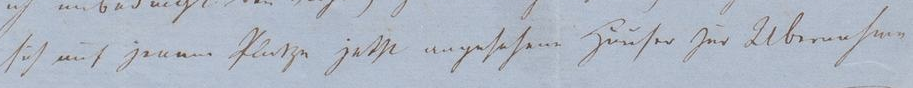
sich mit jenem Platze jetzt angesehene Häuser zur Übernahme
